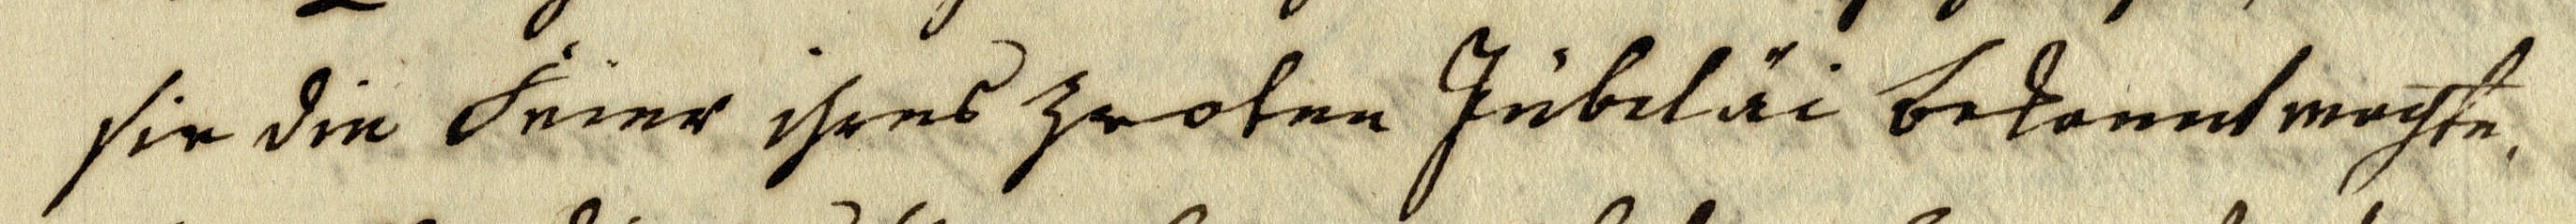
sie die Feier ihres zwoten Jubiläi bekannt machte,
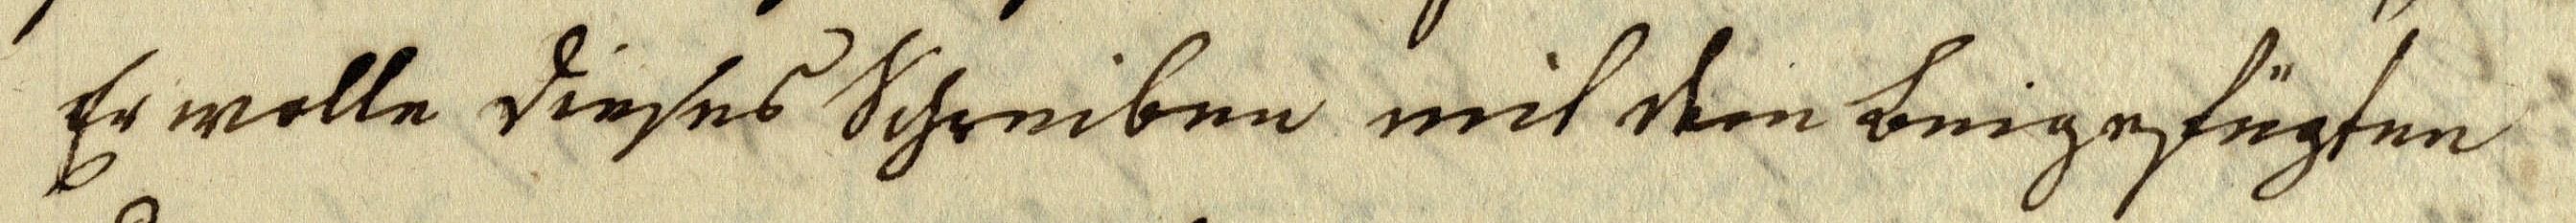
Er wolle dieses Schreiben mit dem beigefügten
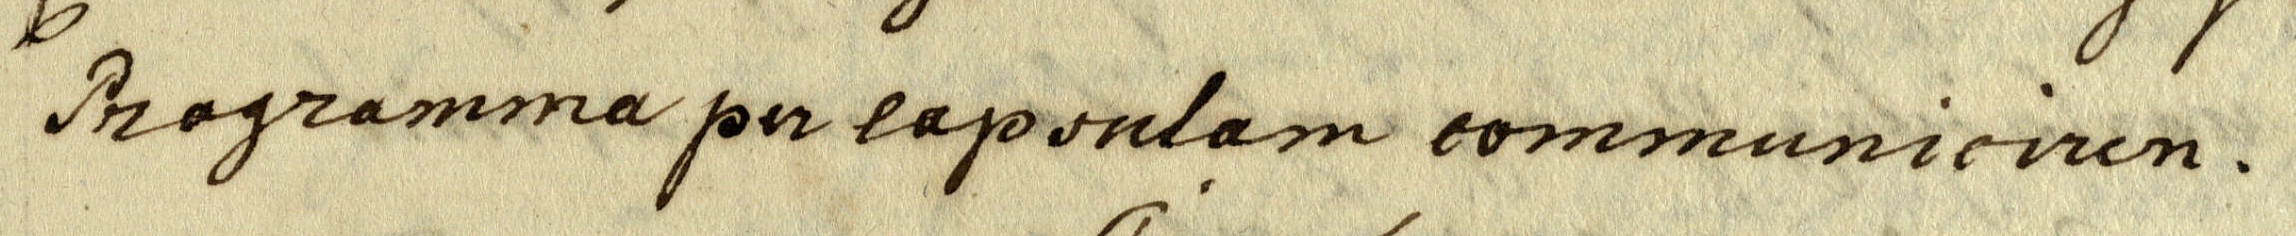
Programma per capsulam communiciren.
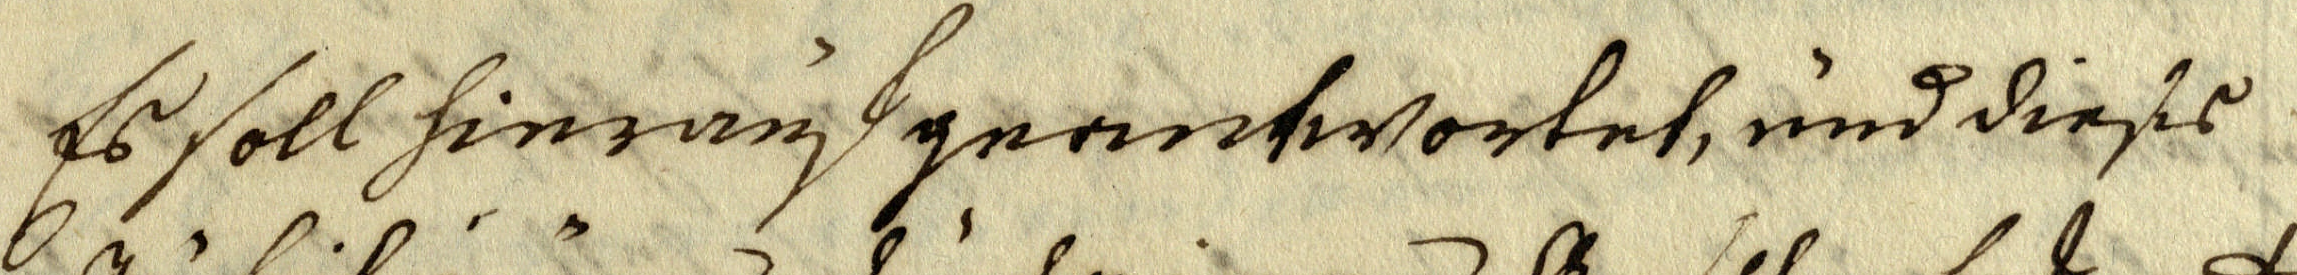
Es soll hierauf geantwortet, und dieses
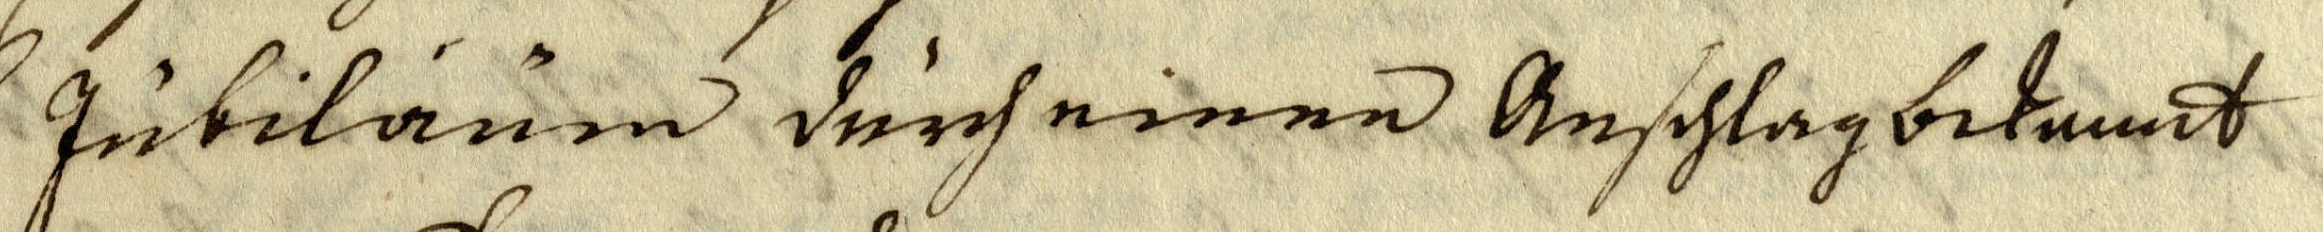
Jubiläum durch einen Anschlag bekannt
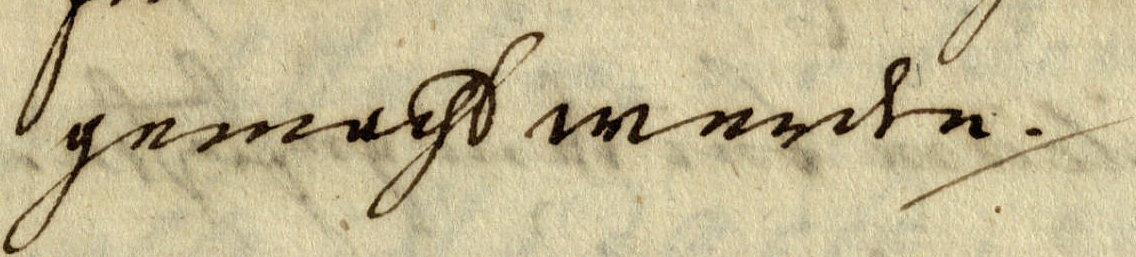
gemacht werden.
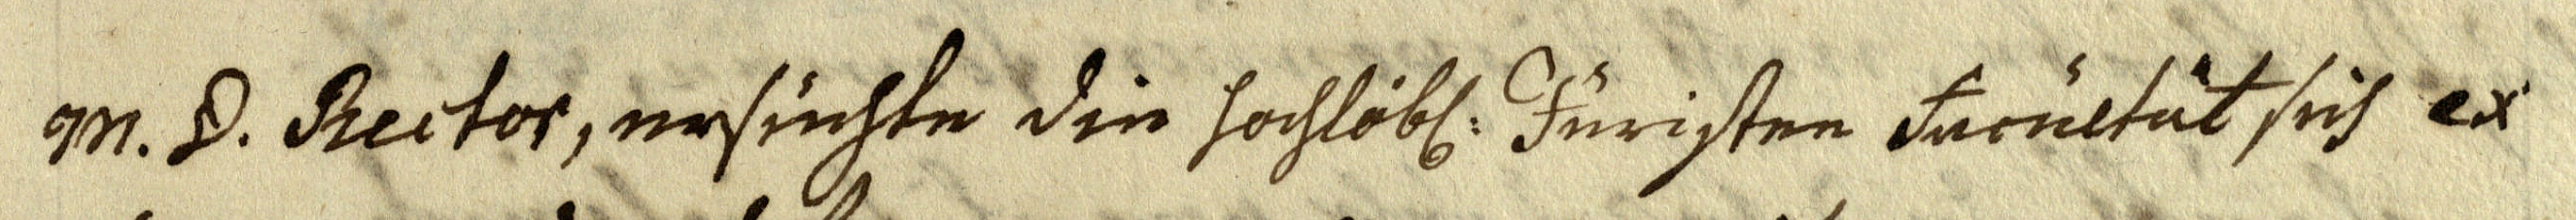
D. M. Rector, ersuchte die hochlöbl. Juristen Facultät sich ex
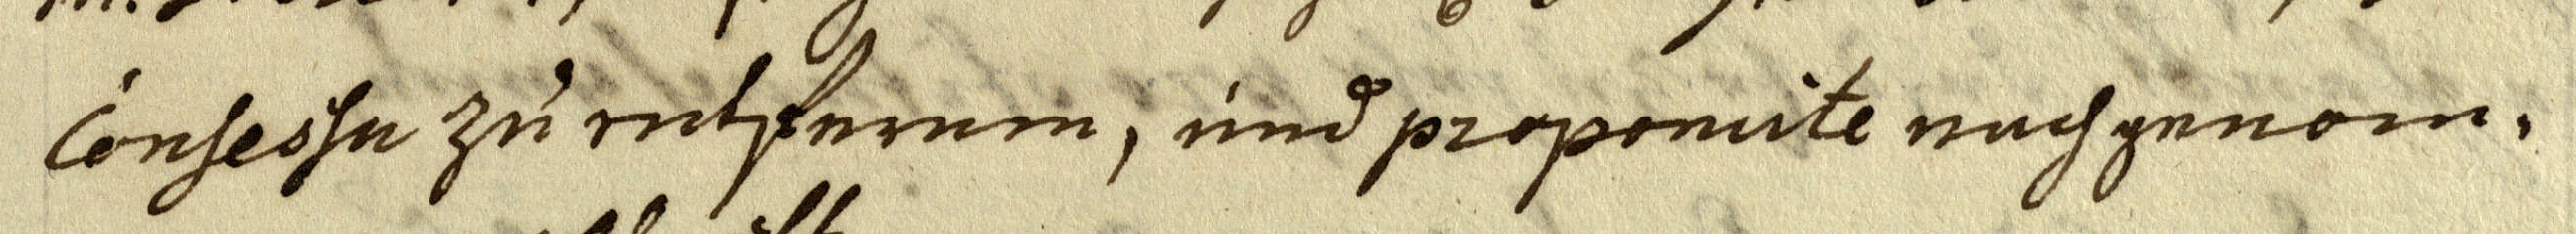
Consessu zu entfernen, und proponirte nach genom¬
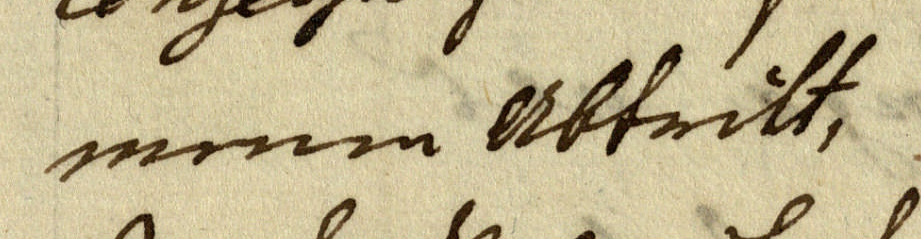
menen Abtritt.
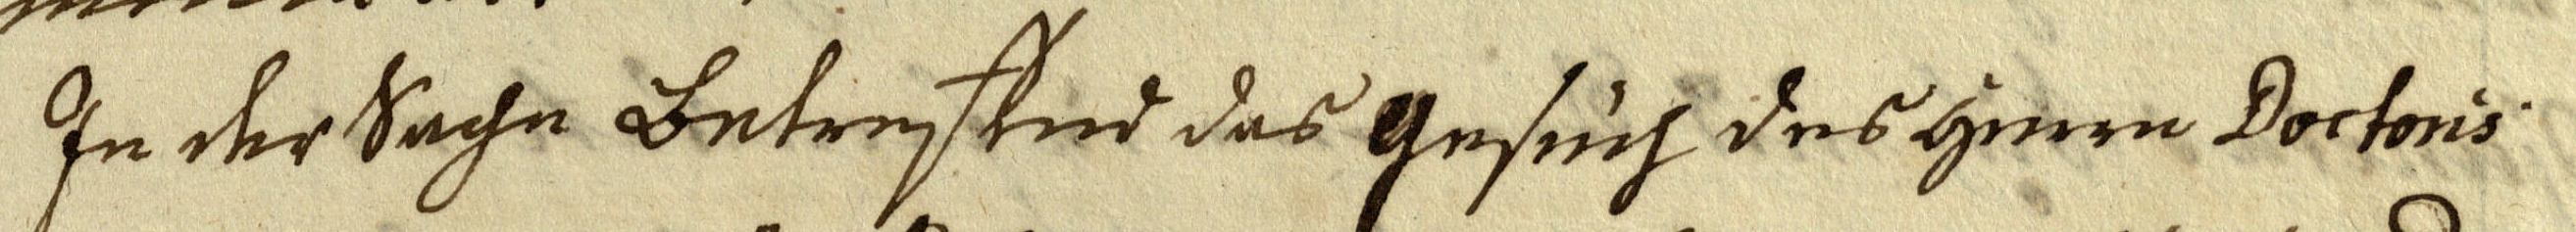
In der Sache betreffend das Gesuch des Herrn Doctoris
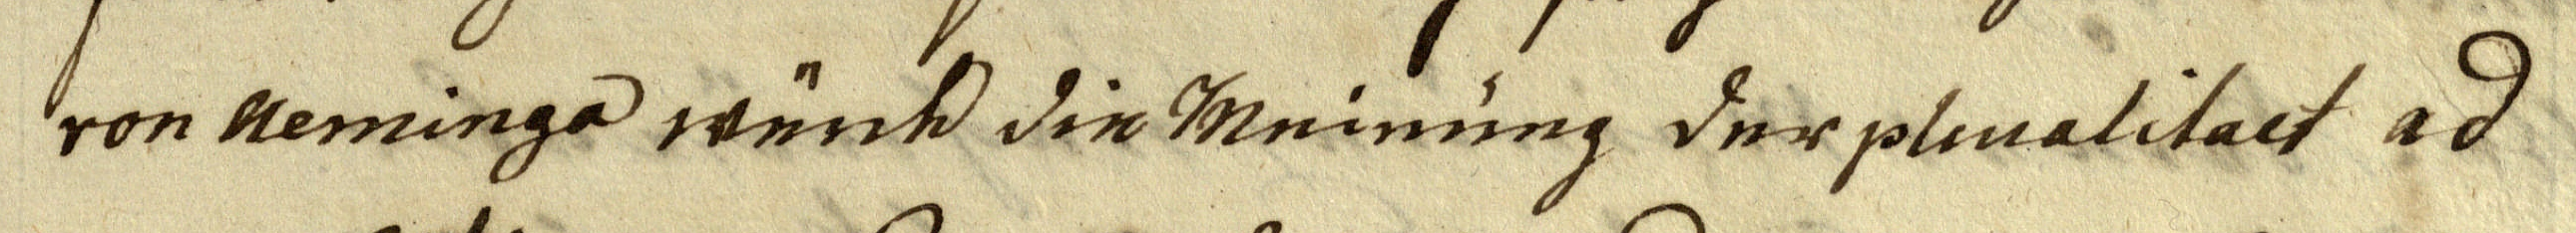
von Aeminga, würde die Meinung der pluralitaet ad
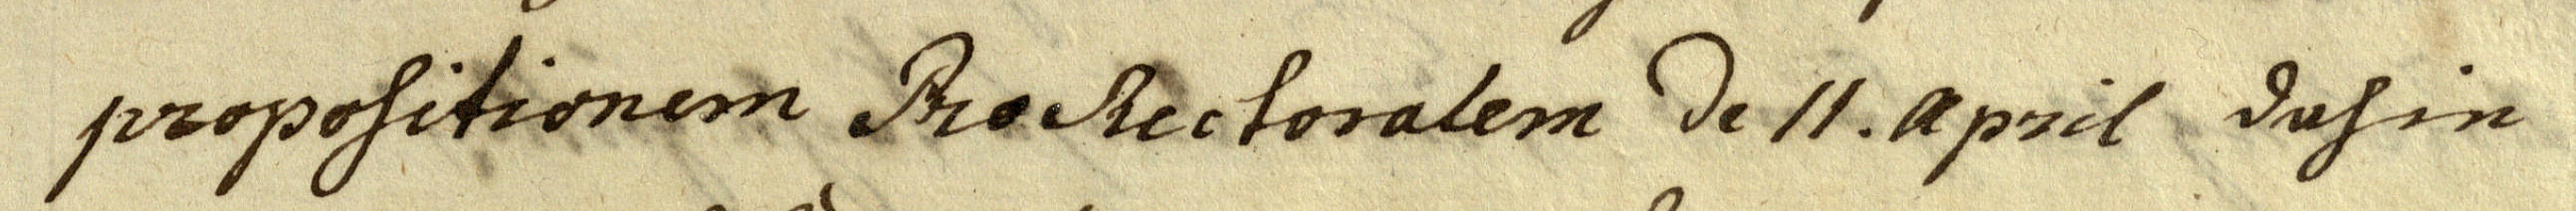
propositionem Pro Rectoratem de 11. April dahin
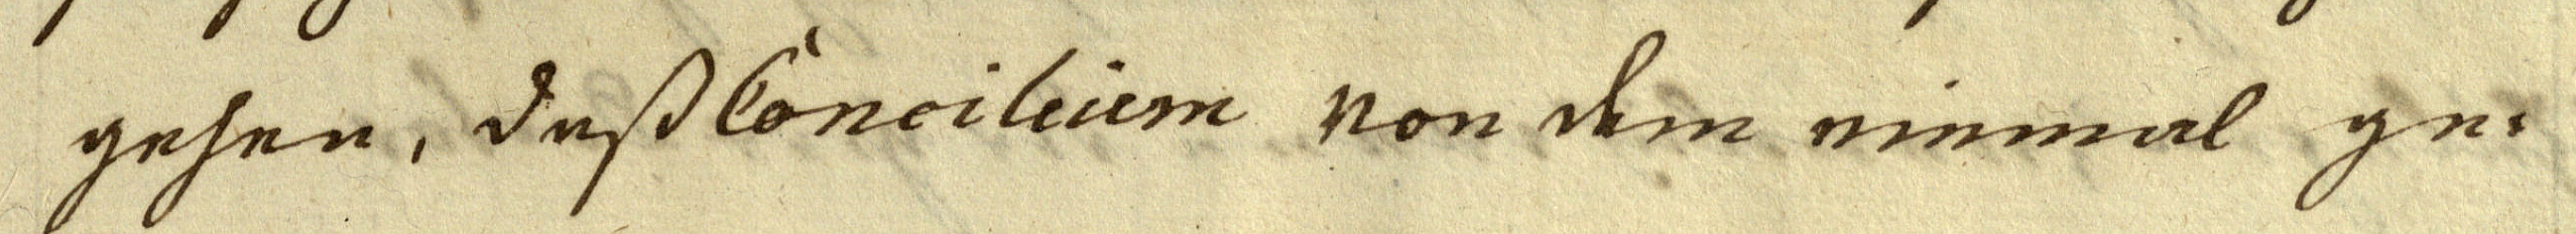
gehen, daß Concilium von dem einmal ge¬
